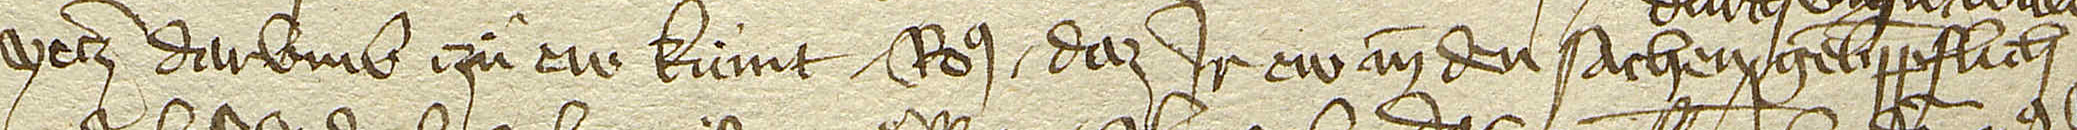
yecʒ* darvmb cʒü ew kümt / Ro* / daʒ Ir ew in den ſachen gelippflich
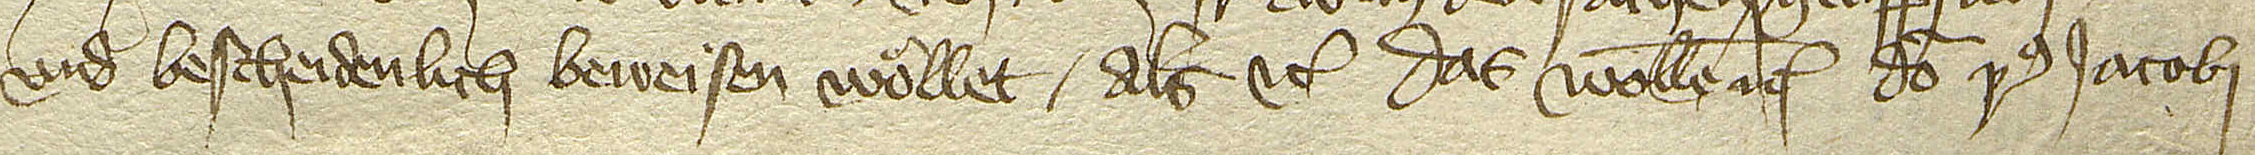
vnd beſcheidenlich beweiſen wöllet / Als ec* das wolle* ec* do* p* Iacobi
